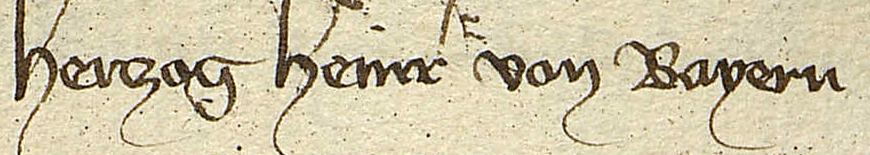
hercʒog heinr* von Bayern
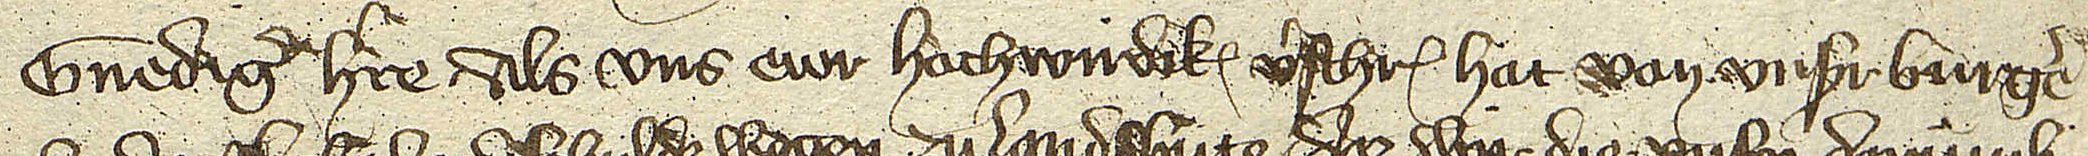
Gnedig* h*re / Als vns ewr hochwirdik* v*ſchr* hat von vnſ*r burge*
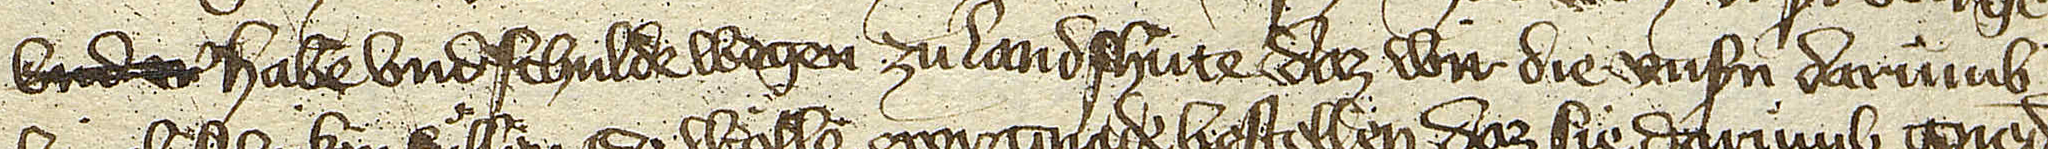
vnd ir* habe vnd ſchulde wegen ʒu landſhute / daʒ wir die vnſ*n darümb
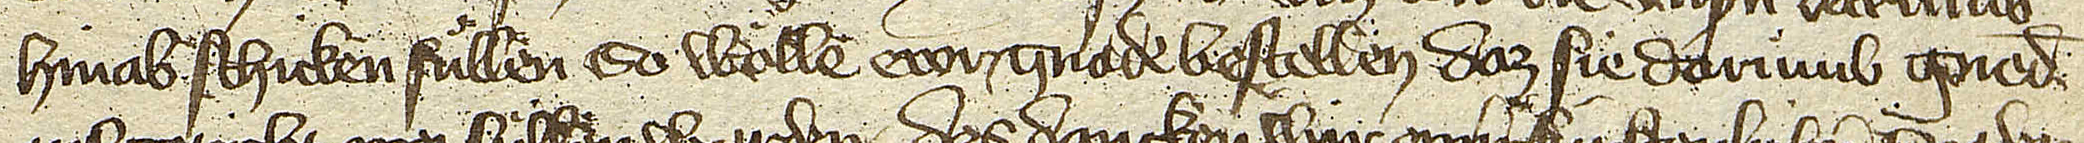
hinab ſchicken ſüllen So wölle ewr gnade beſtellen daʒ ſie darümb gned*
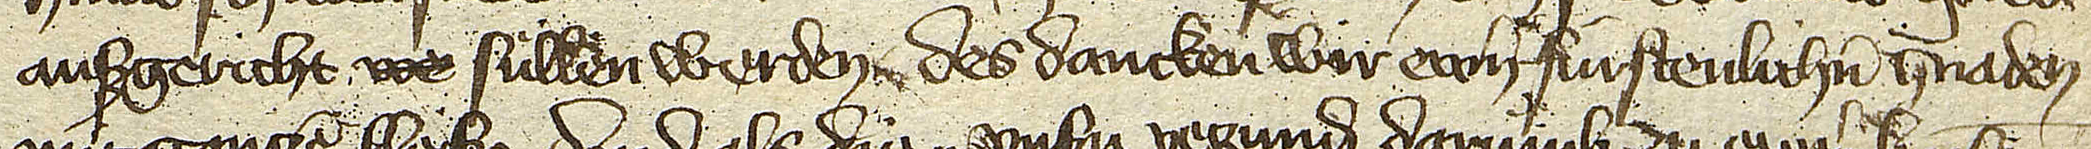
auſʒgericht we ſüllen werden / des dancken wir ew*n fürſtenlichn* gnaden
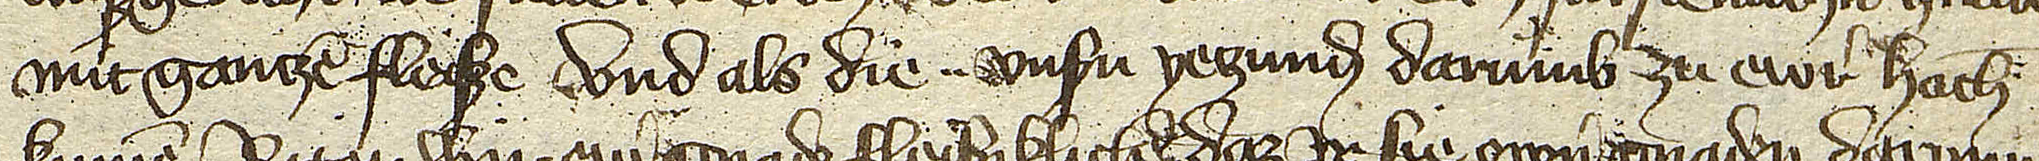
mit gancʒe* fleiſʒe / vnd als die ~ vnſ*n yecʒund* darümb ʒu ewr* hoch*
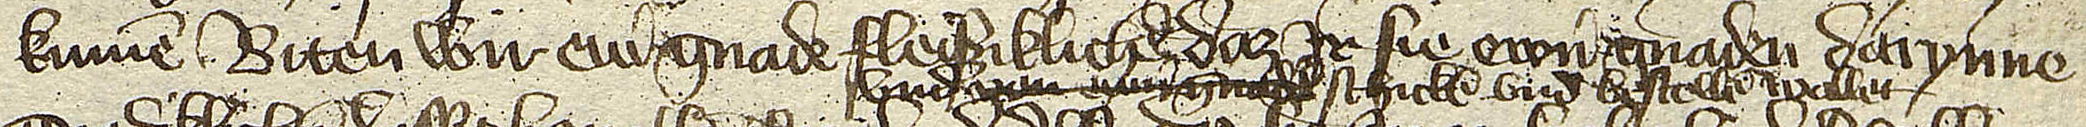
kume* Biten wir ew* gnade fleiſʒikliche* daʒ Ir ſie ewn* gnaden darynne
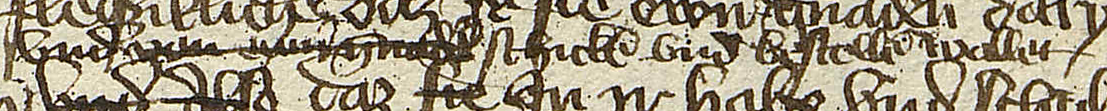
vnd von ewn* gnade* ſchicke* vnd beſtelle* wollet
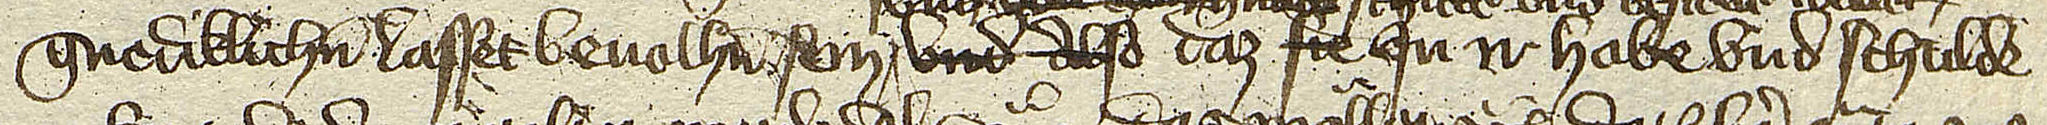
gnediklichn* laſſet beuolhn* ſein vnd Alſo daʒ ſie In ir gabe vnd ſchulde
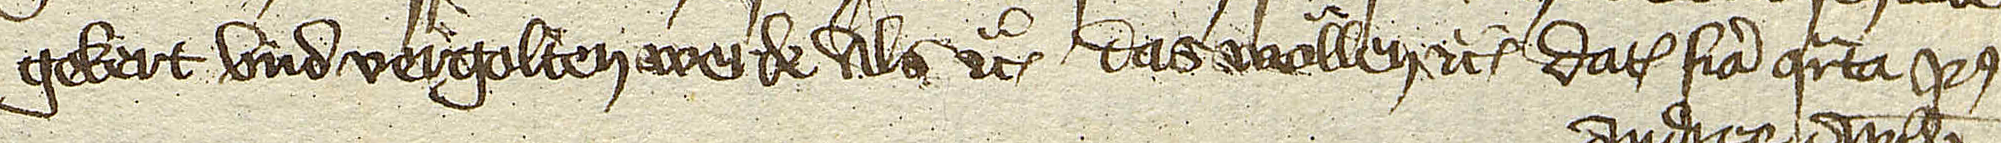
gekert vnd vergolten werde Als ec* das wöllen ec* dat* fia* qrta* p*
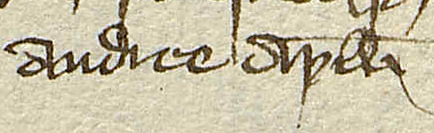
Andree Aplli*
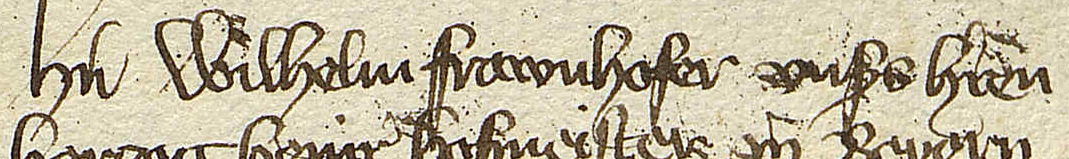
hn* Wilhelm Frawnhofer vnſ*s h*ren
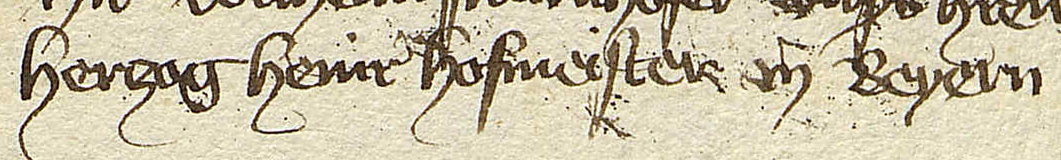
hercʒog heinr* hofmeiſter in Beyern
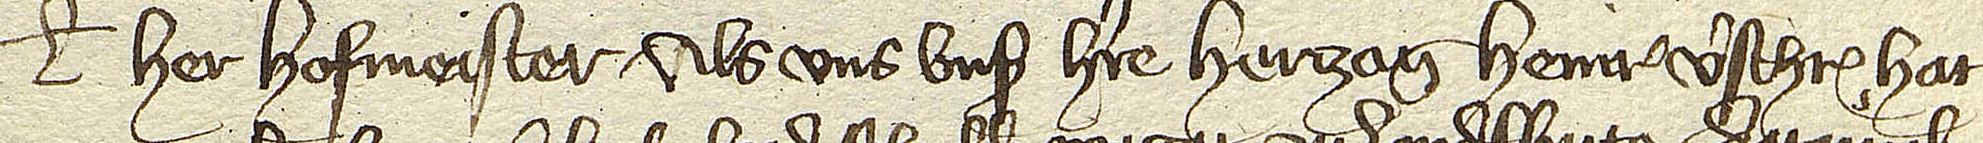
L* her hofmeiſter / Als vns vnſ* h*re hercʒog heinr* v*ſchr* hat
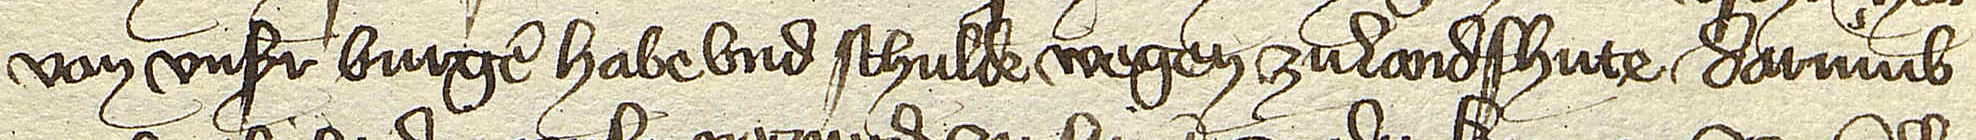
von vnſ*r burge* habe vnd ſchulde wegen cʒu landſhute / darümb
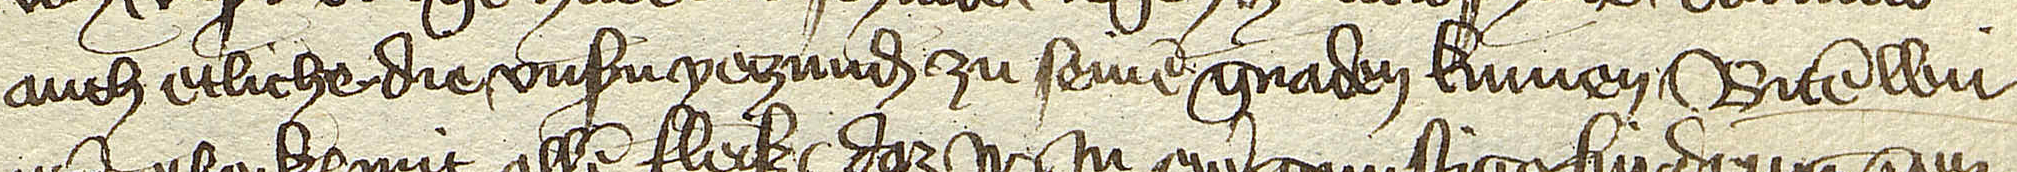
auch etliche die vnſ*n yecʒund* cʒu ſeine* gnaden kumen / Bite* wir
